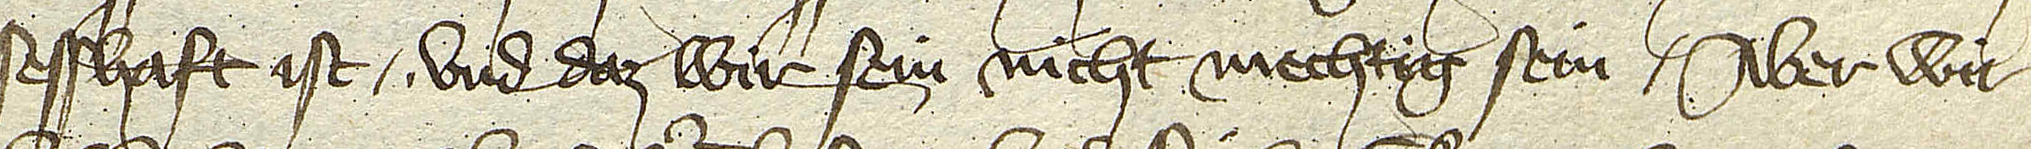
ſeſſhaft iſt / . vnd daʒ wir ſein nicht mechtig ſein / Aber wir
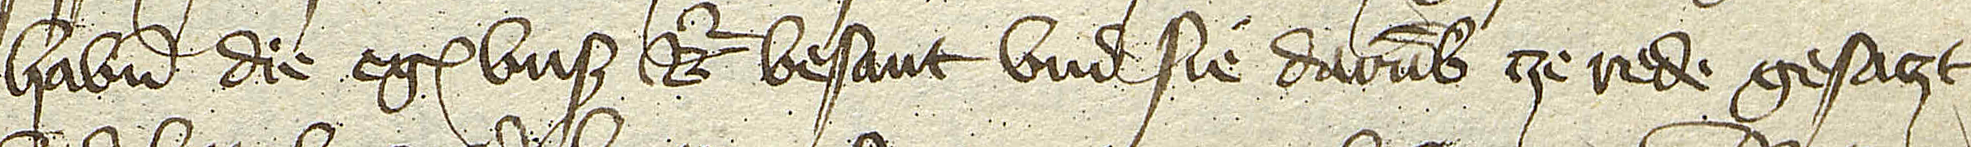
habn* die eg* vnſ* B* beſant vnd ſie darub* cʒe rede geſacʒt
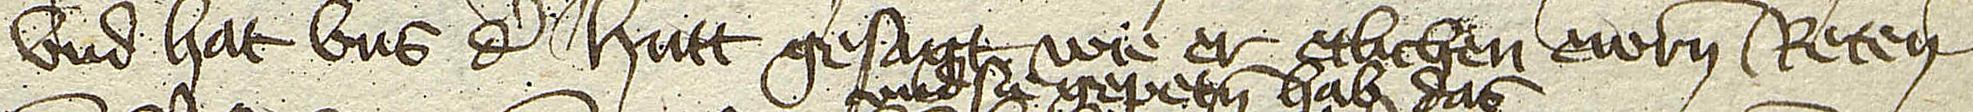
vnd hat vns d* Hutt geſagt wie er etlichen ewrn* Reten
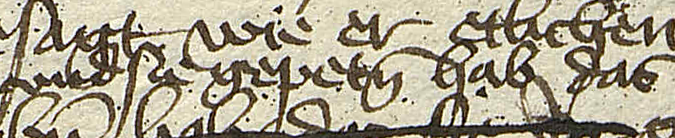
vnd ſie gepetn* hab das
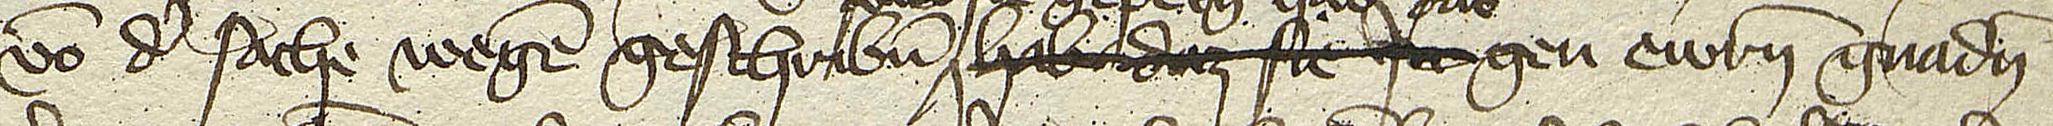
vo* d* ſache wege* geſchribn* hab / daʒ ſie In gen ewrn* gnadn*
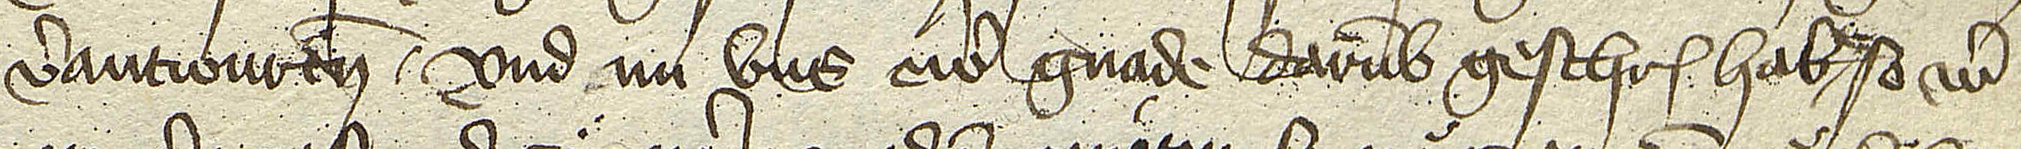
v*antwurtn* / vnd nu vns ew* gnade darub* geſchr* hab / ſo w*
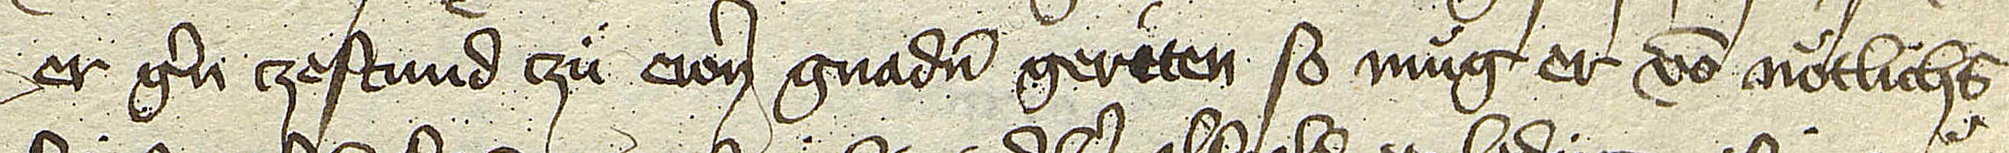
er g*n cʒeſtund cʒü ew*n gnadn* geriten ſo müg er vo* nötlichs
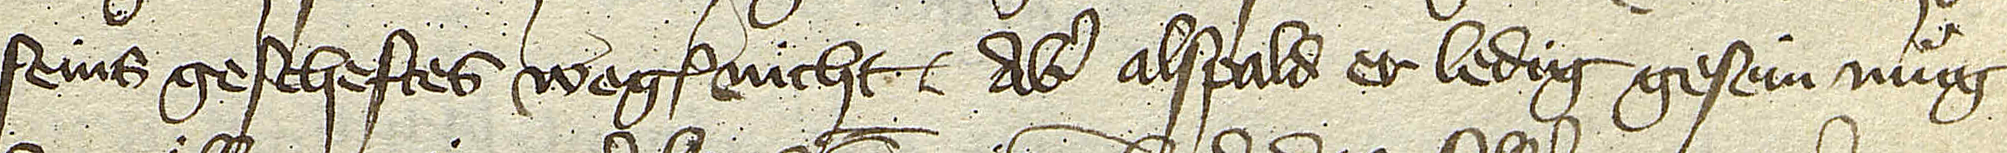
ſeins geſcheftes weg* nicht / Ab* alſpald er ledig geſein müg
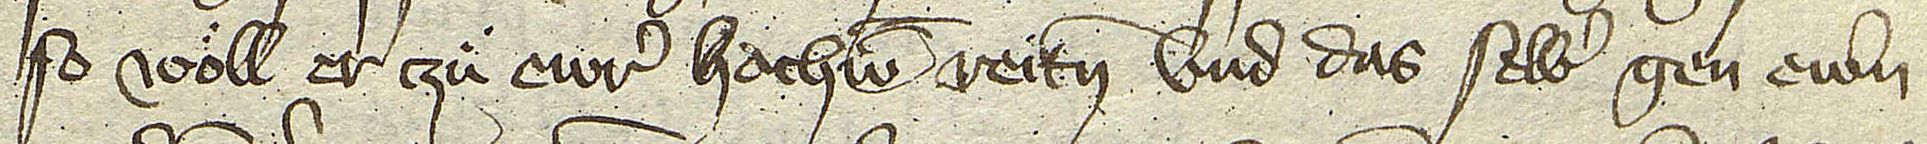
ſo wöll er cʒü ewr* hochw* reitn* vnd das ſelb* gen ewn*
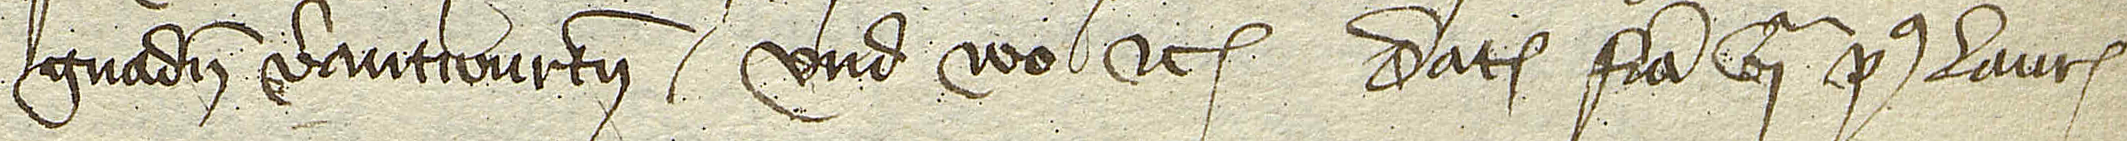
gnadn* v*antwurtn* / vnd wo ec* Dat* fia* vi* p* Laur*
